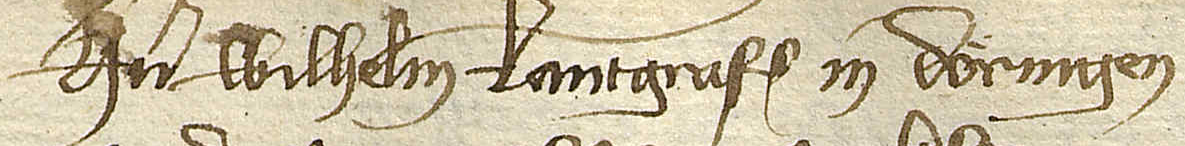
Hn* Wilhelm Lantgraf* in Döringen
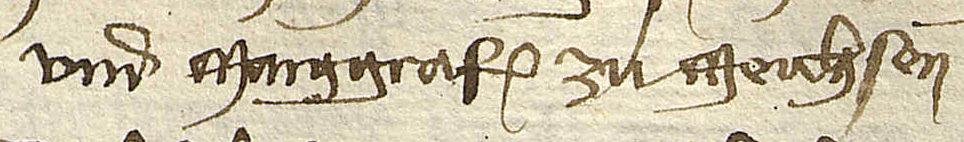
vnd Marggraf* ʒu Meichſen
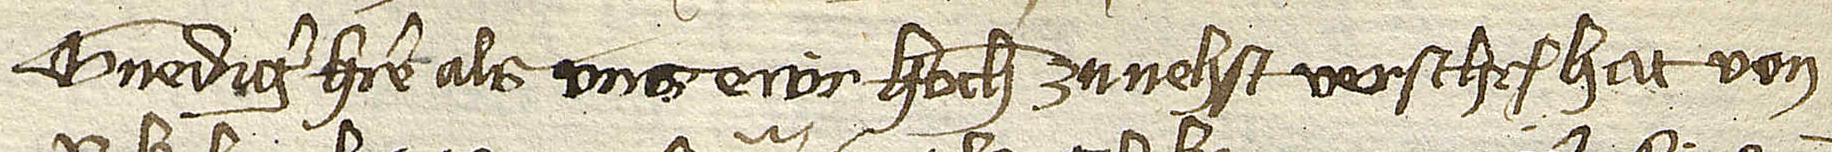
Gnedig* hr*e als vns ewr Hoch* ʒunehſt verſchr* hat von
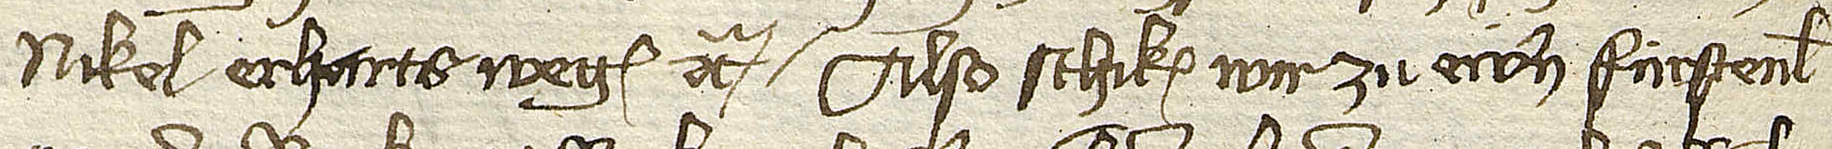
Nikel erharts weg* ec* / Alſo ſchik* wir ʒu ew*n fürſtenl*
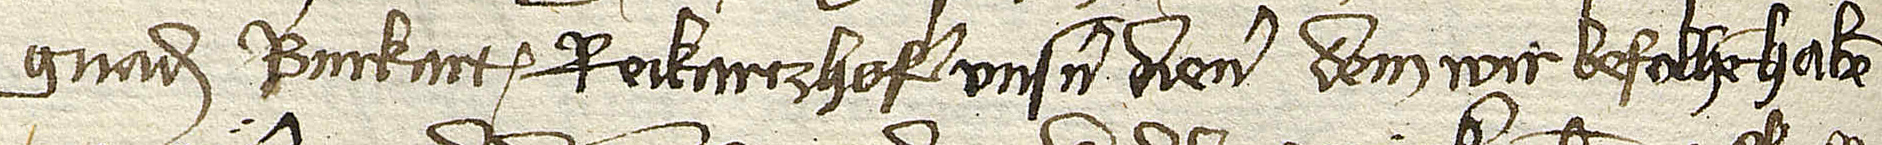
gnad* Burkart* Reikarcʒhof* vnſn* dien* Dem wir befolhe* habe*
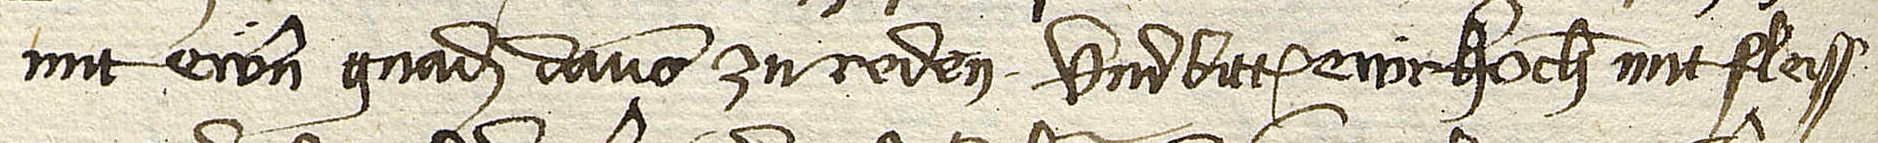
mit ew*n gnad* dauo* cʒu reden . vnd bitt* ewr Hoch* mit fleiſſ
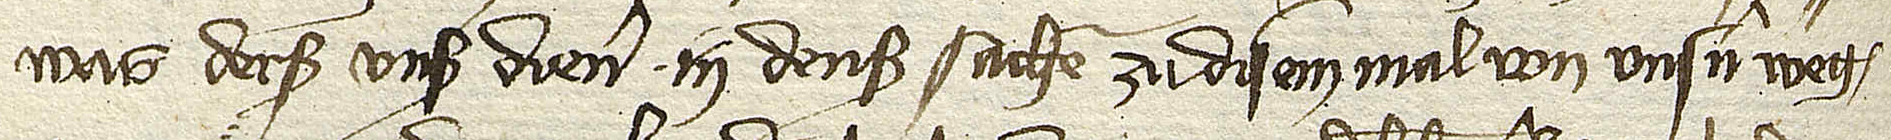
was derſ* vnſ* dien* . in denſ* ſache* ʒu diſem mal von vnſ*n weg*
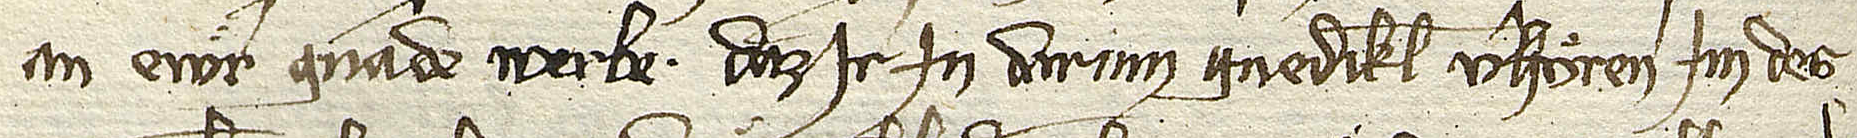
an ewr gnade werbe . daʒ Ir In darinn gnedikl* v*hören Im des
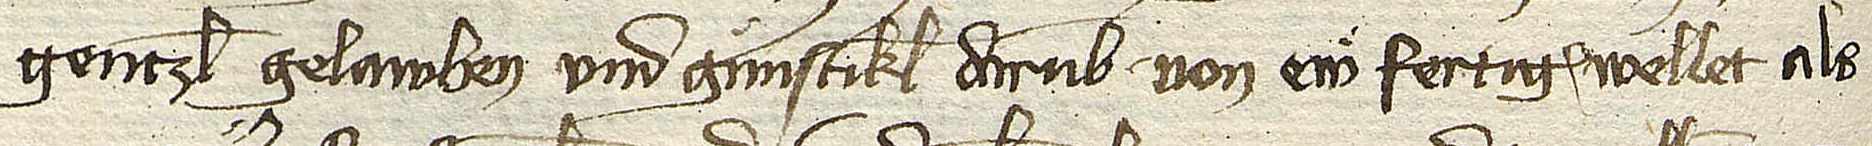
gencʒl* gelawben vnd günſtikl* darub* / von ew fertig* wellet als
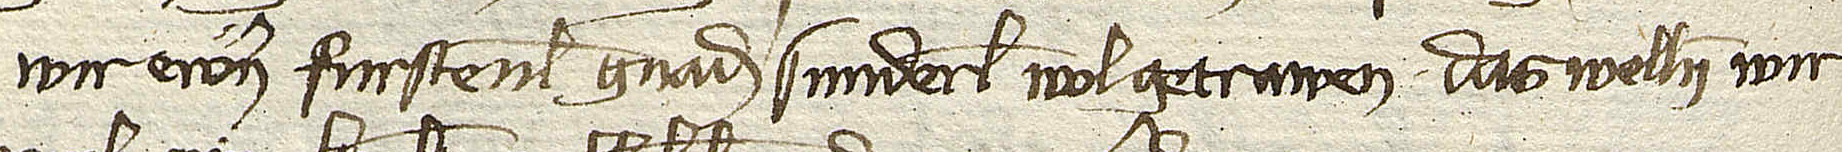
wir ew*n furſtenl* gnad* ſunderl* wol getrawen . das welln* wir
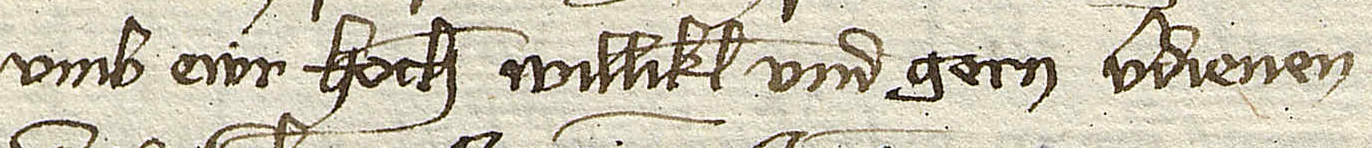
vmb ewr Hoch* willikl* vnd gern v*dienen
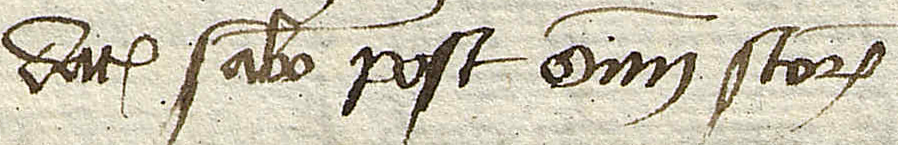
Dat* ſabo* poſt Omi* ſco*
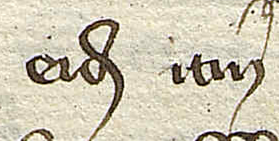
eid* itm*
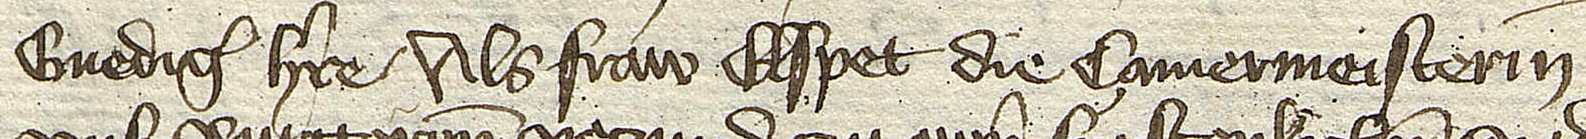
Gnedig* h*re / Als fraw Elſpet die Camermeiſterin
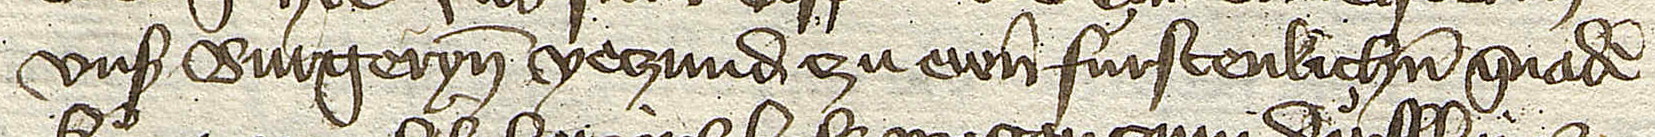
vnſ* Burgeryn* yecʒund cʒu ewn* fürſtenlichn* gnad*
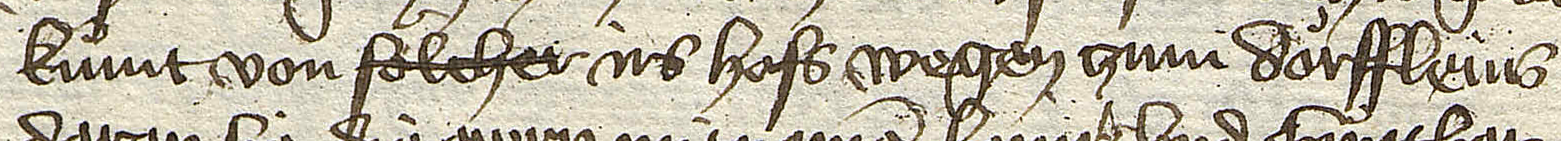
kümt von ſölcher irs hofs wegen cʒum dörffleins
